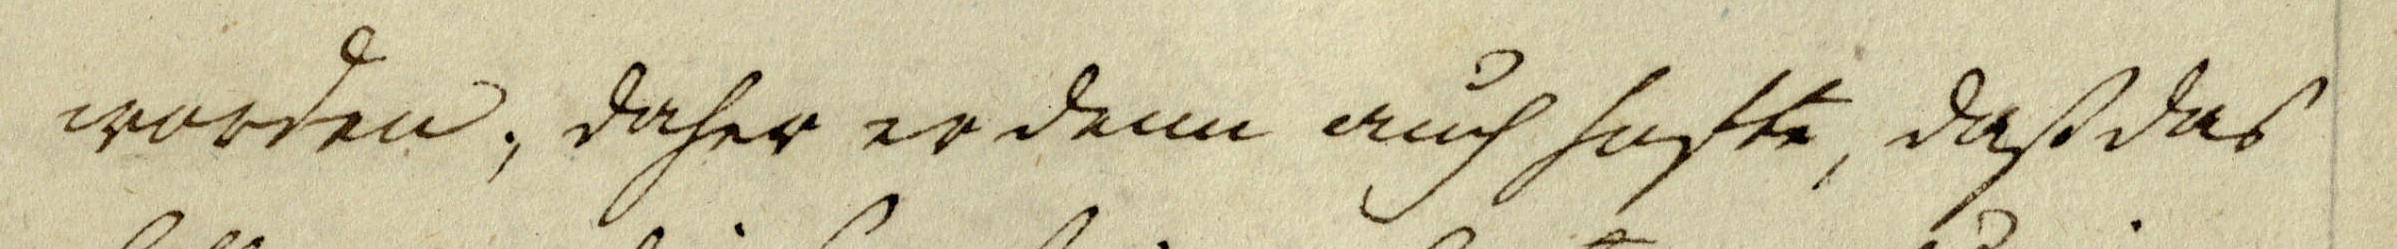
worden; daher er denn auch hofte, daß das
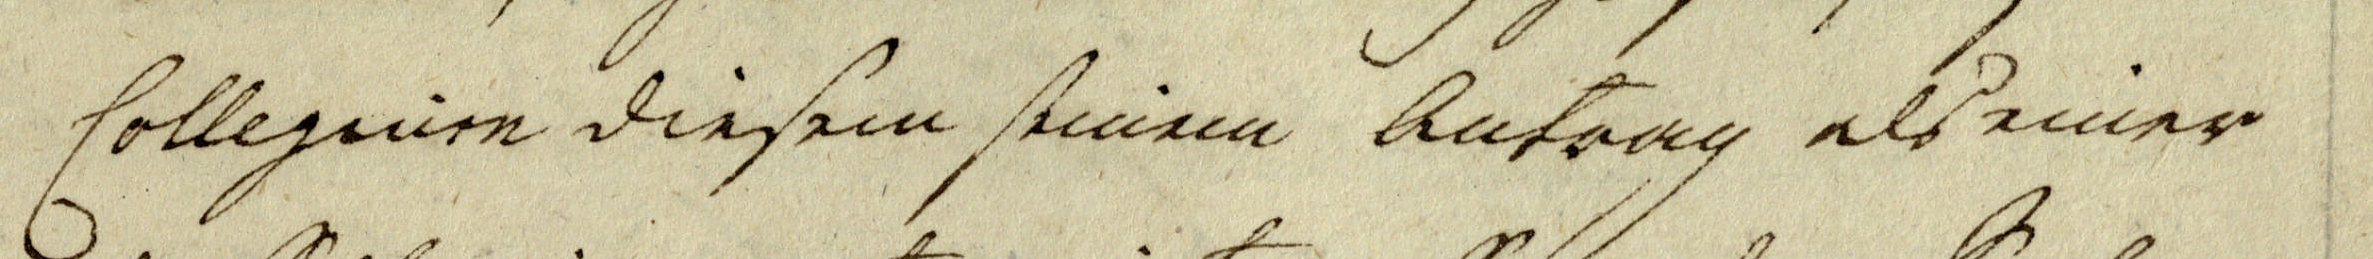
Collegium diesem seinem Antrag als einer
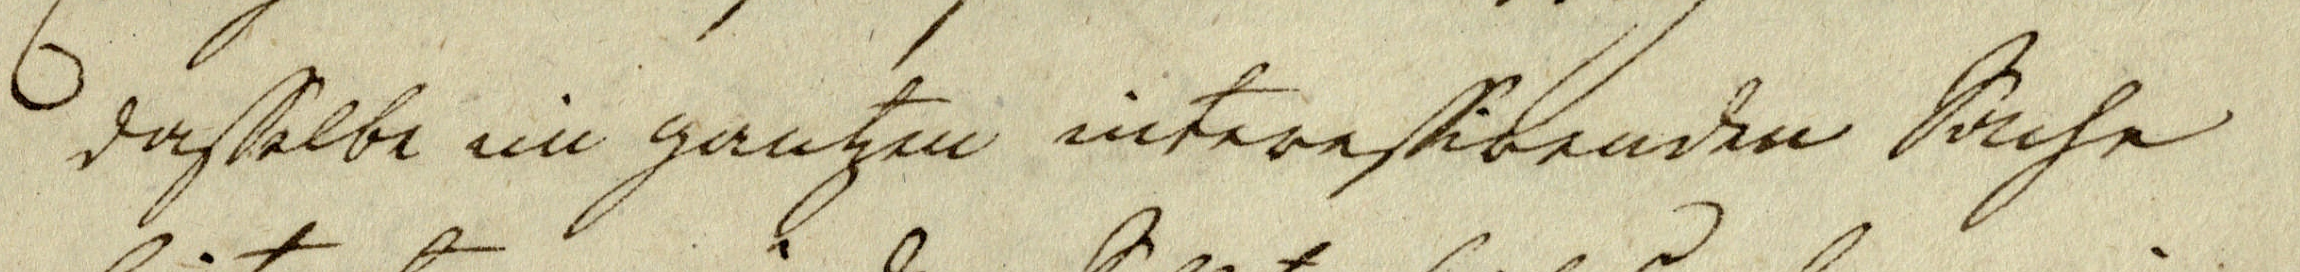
dasselbe in gantzen interessirenden Sache
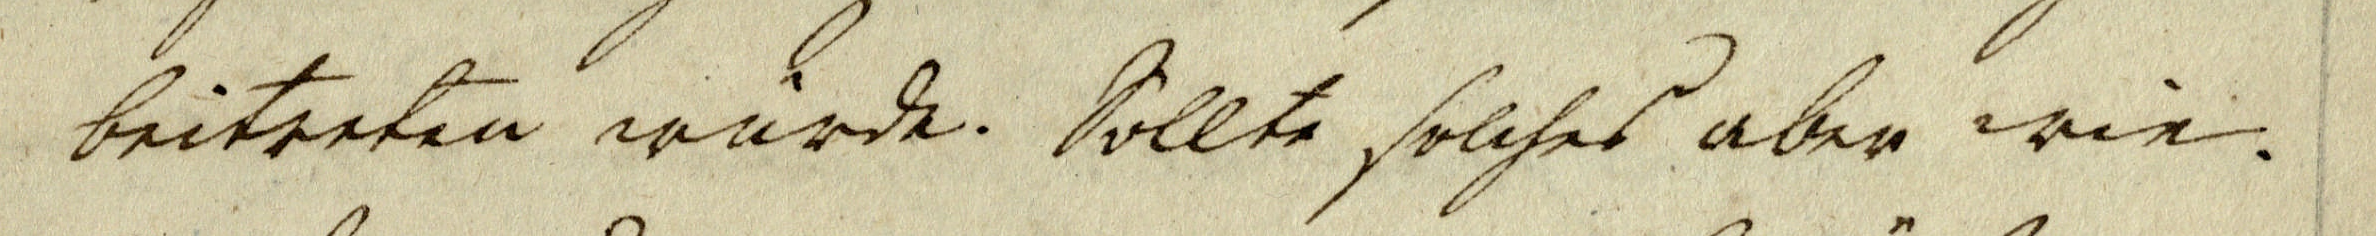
beitreten würde. Sollte solches aber wie¬
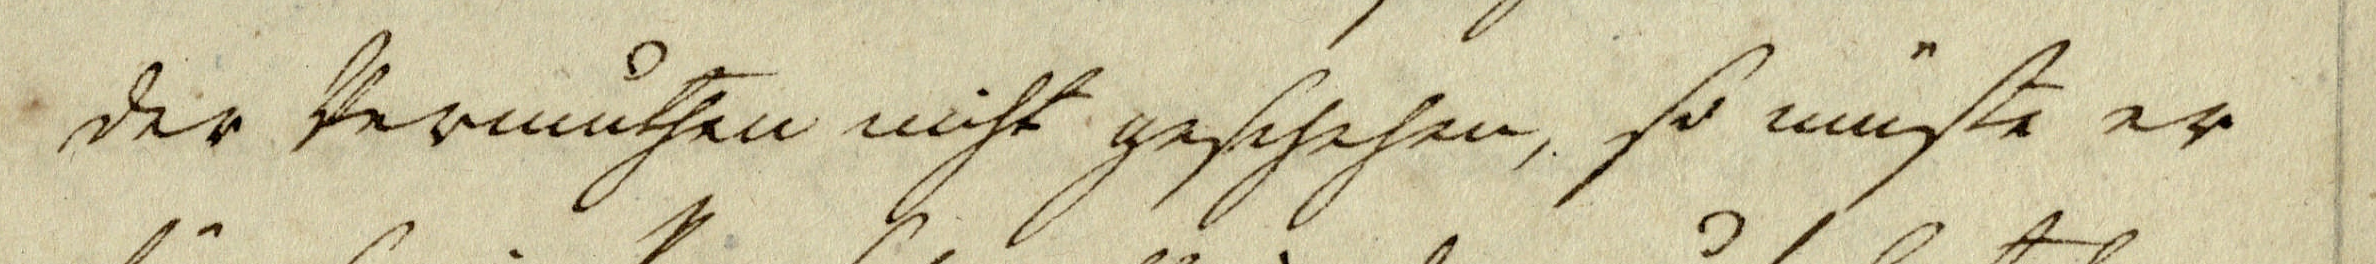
der Vermuthen nicht geschehen, so müßte er
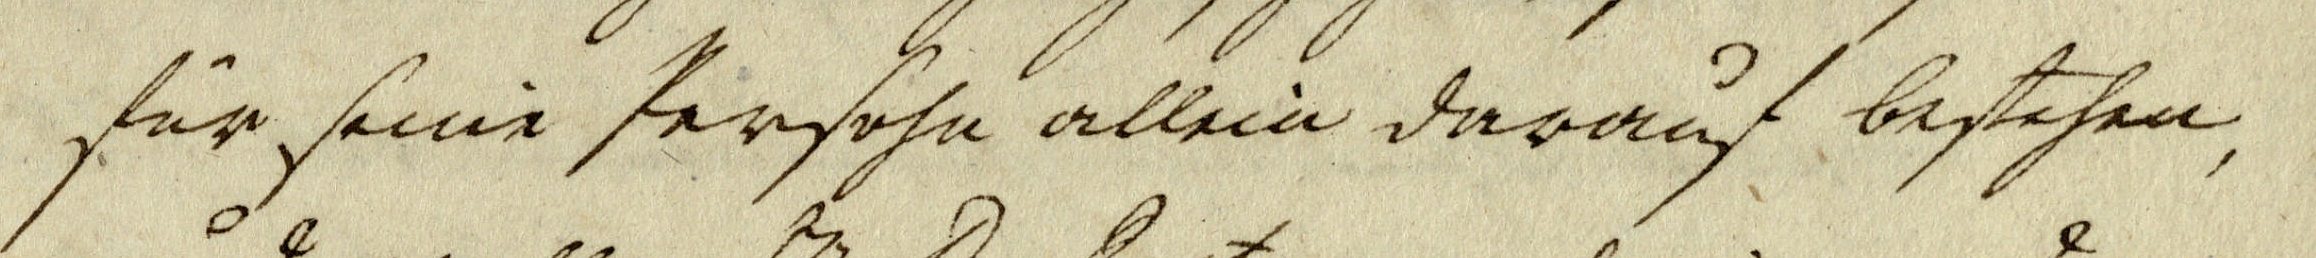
für seine Persohn allein darauf bestehen,
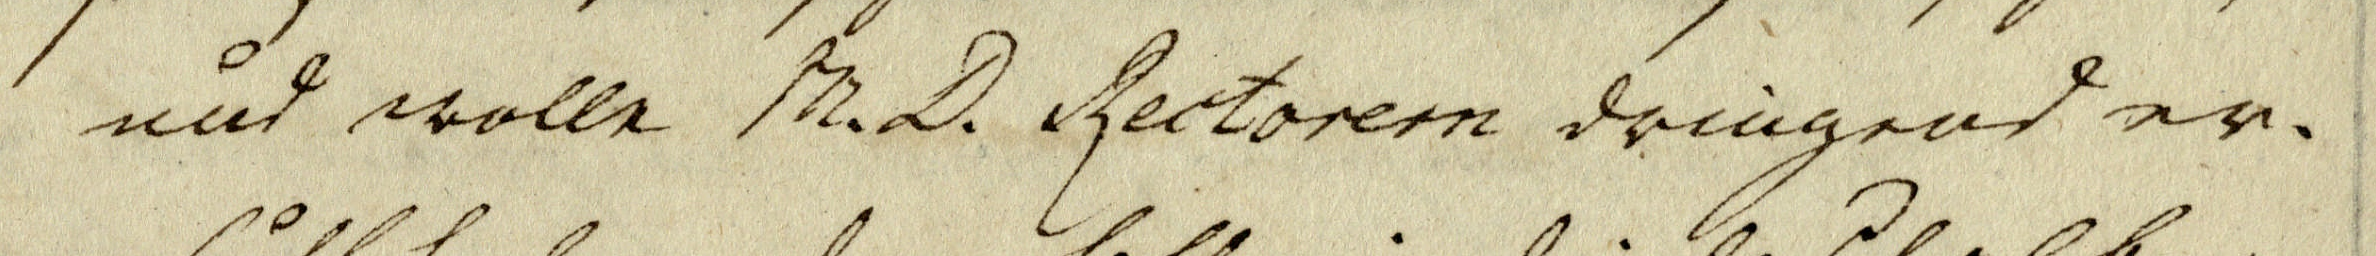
und wolle M. D. Rectorem dringend er¬
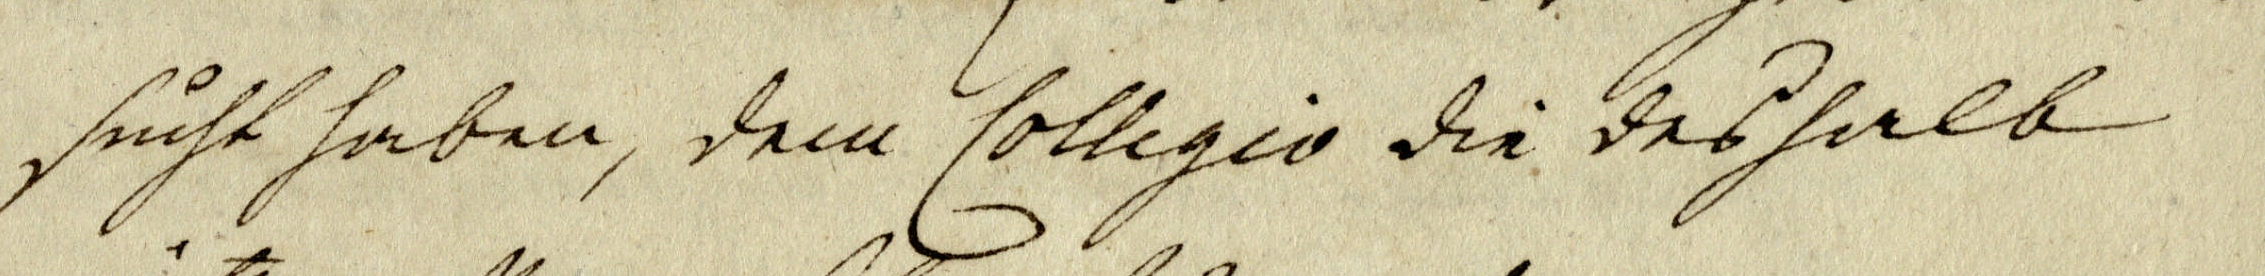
sucht haben, dem Collegio die deshalb
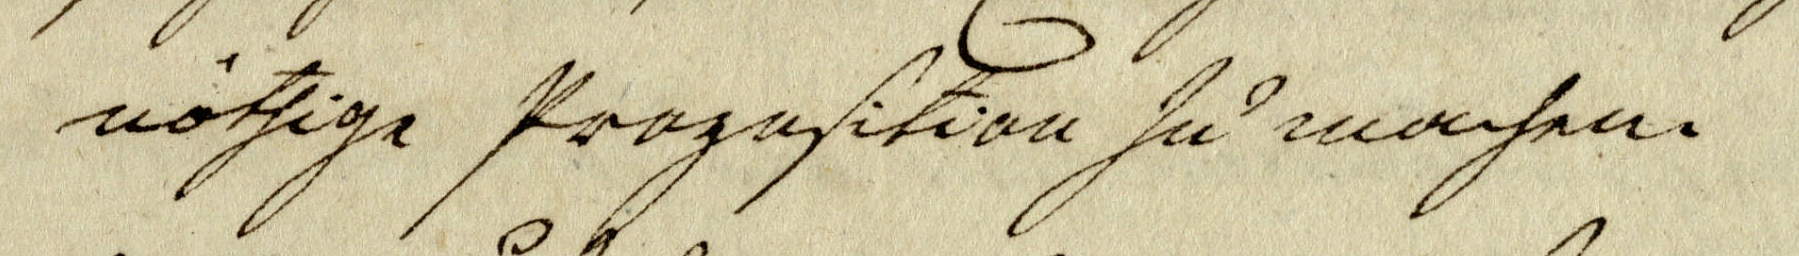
nöthige Proposition zu machen.
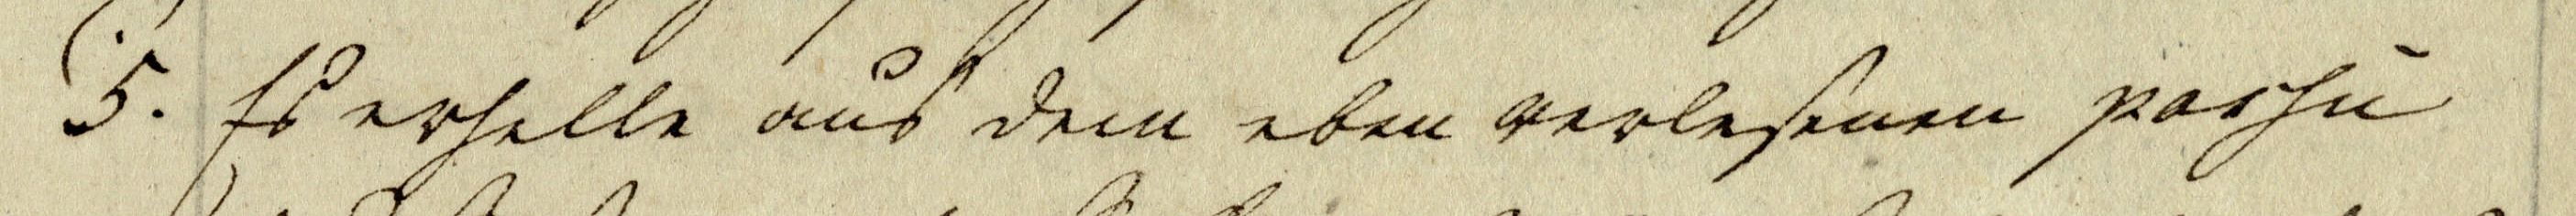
5. Es erhelle aus dem eben verlesenen passu
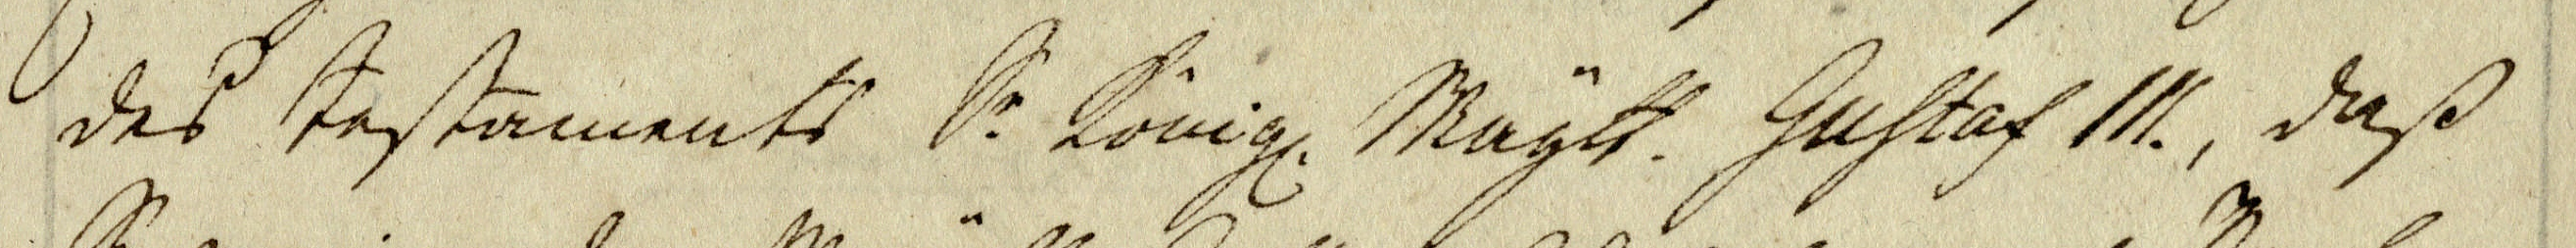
des Testamenmts Sr Königl. Maÿtt. Gustaf III., daß
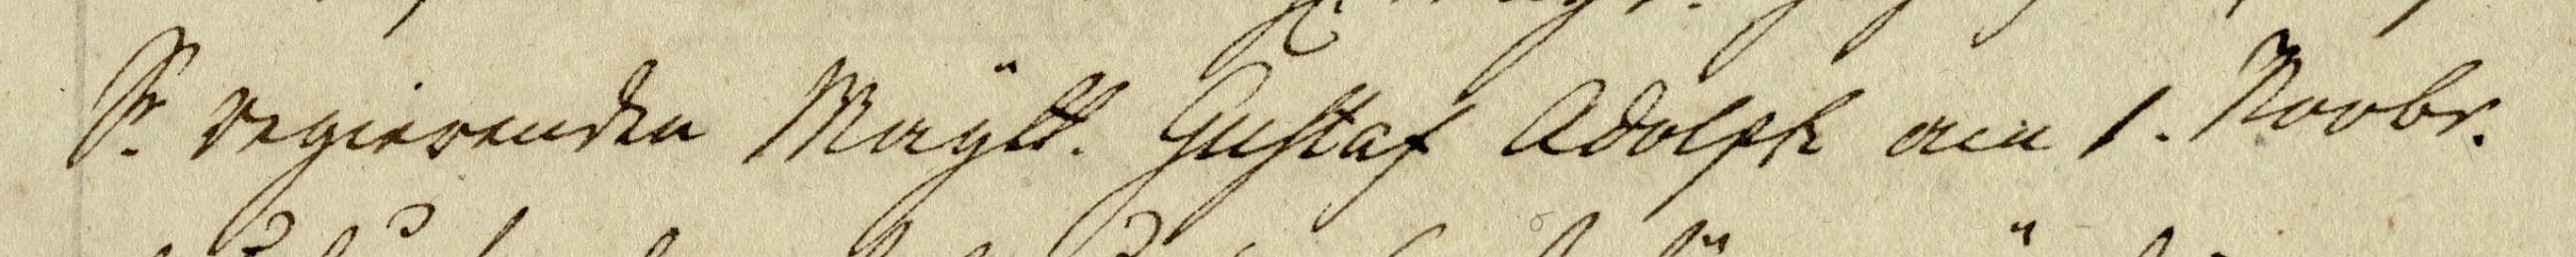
Sr. regierenden Maÿtt. Gustaf Adolph am 1. Novbr.
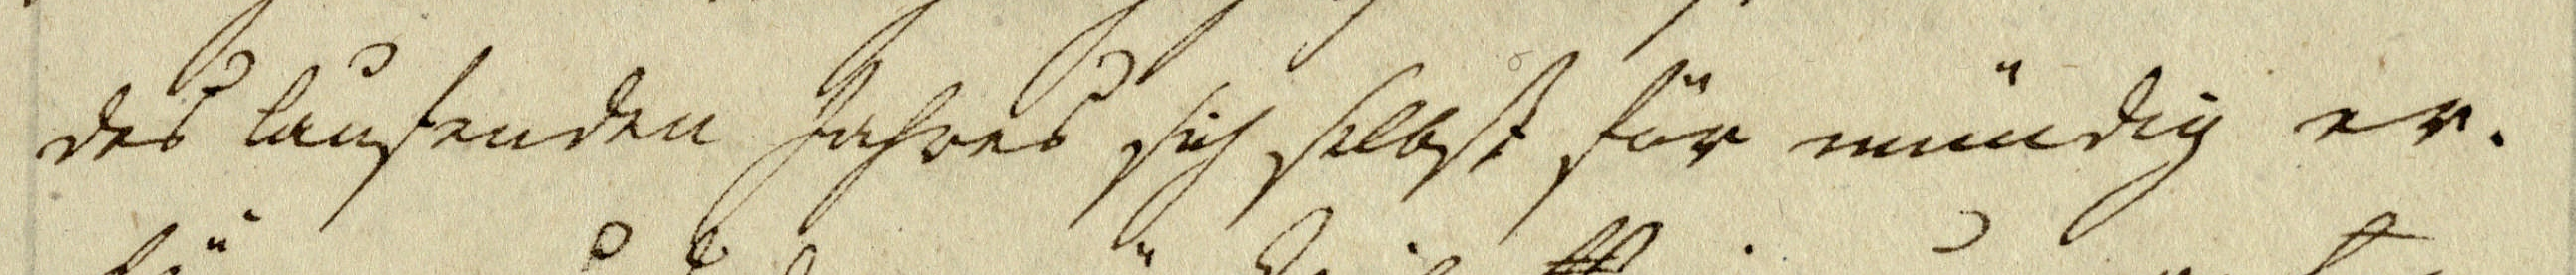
des laufenden Jahres sich selbst für mündig er¬
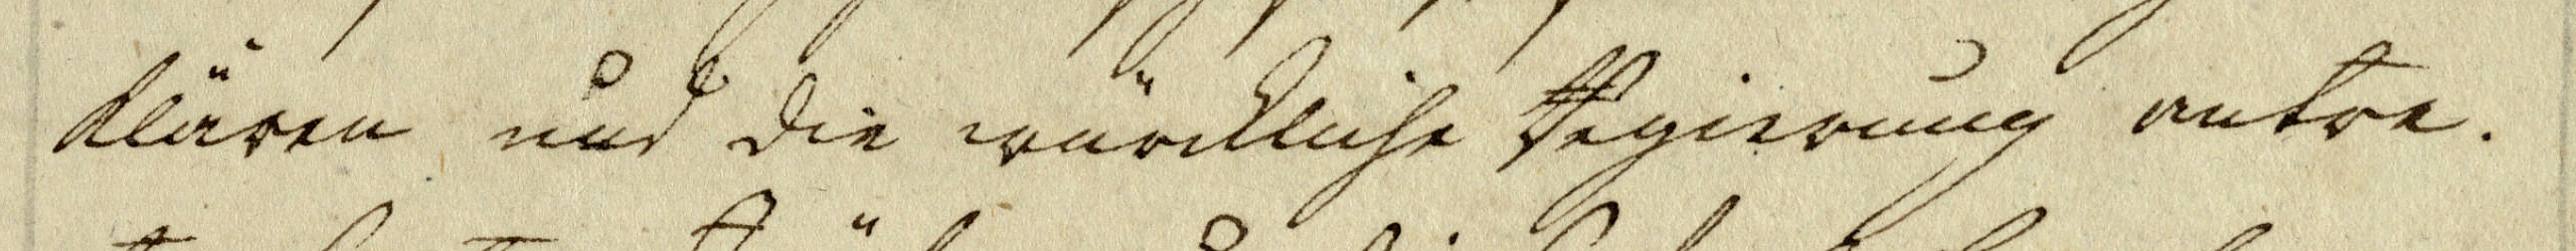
klären und die würckliche Regierung antre¬
